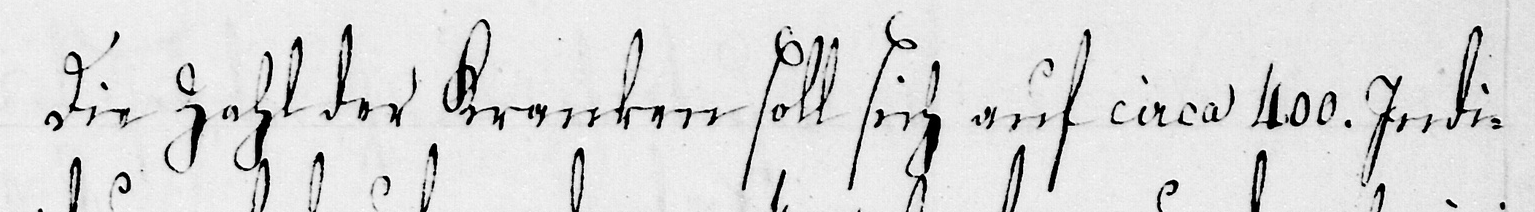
Die Zahl der Kranken soll sich auf circa 400. Indi¬
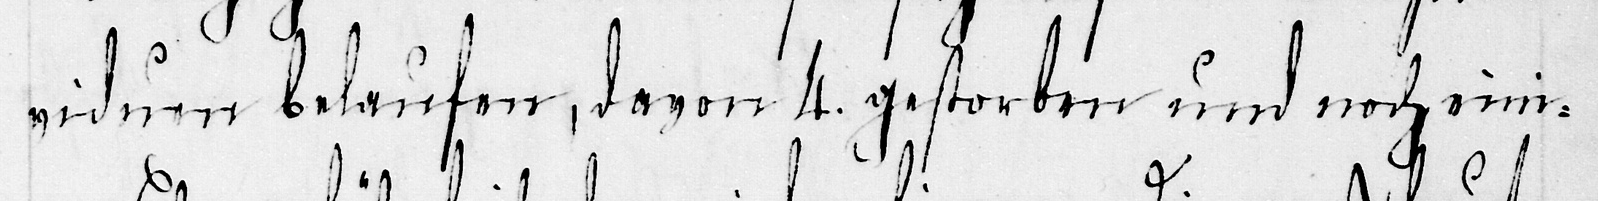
viduen belaufen, davon 4. gestorben und noch eini¬
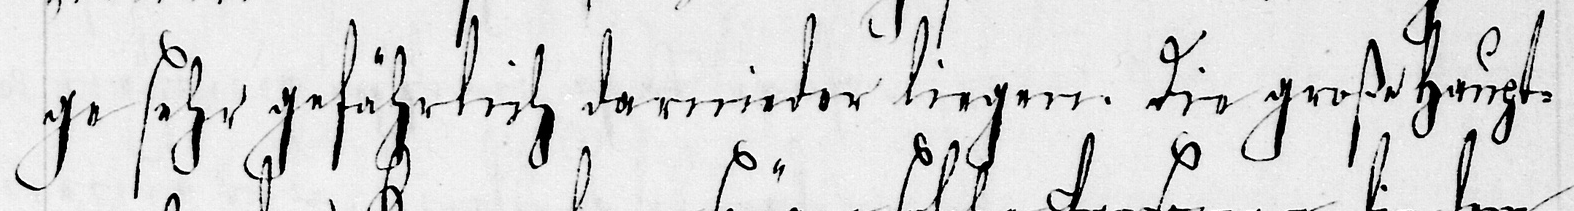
ge sehr gefährlich darnieder liegen. Die große Haupt¬
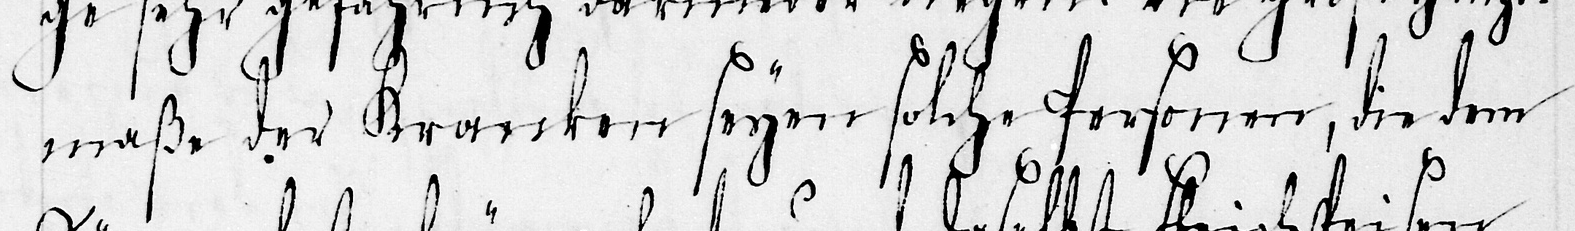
maße der Kranken seyen solche Personen, die dem
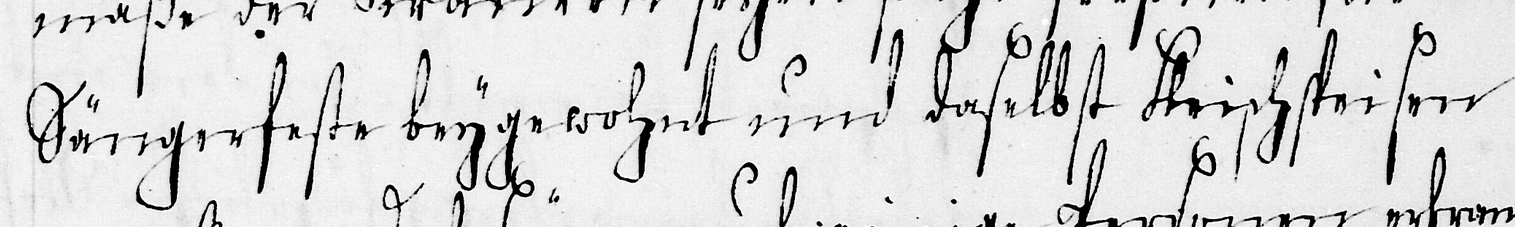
Sängerfeste beygewohnt und daselbst Fleischspeisen
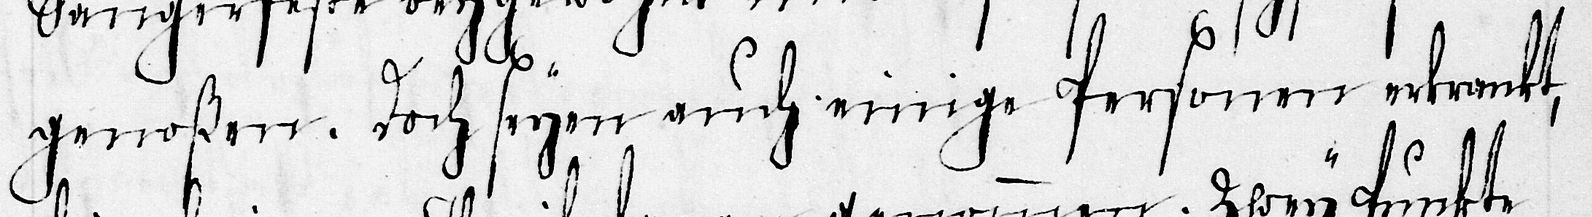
genoßen. Doch seyen auch einige Personen erkrankt,
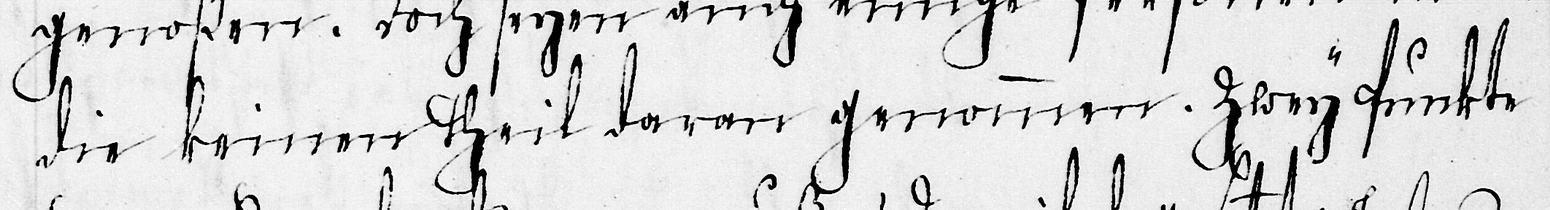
die keinen Theil daran genommen. Zwey Punkte
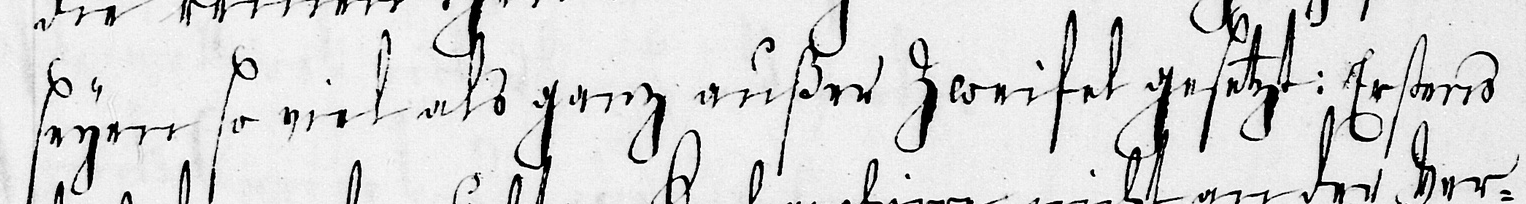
seyen so viel als ganz außer Zweifel gesetzt: Erstens
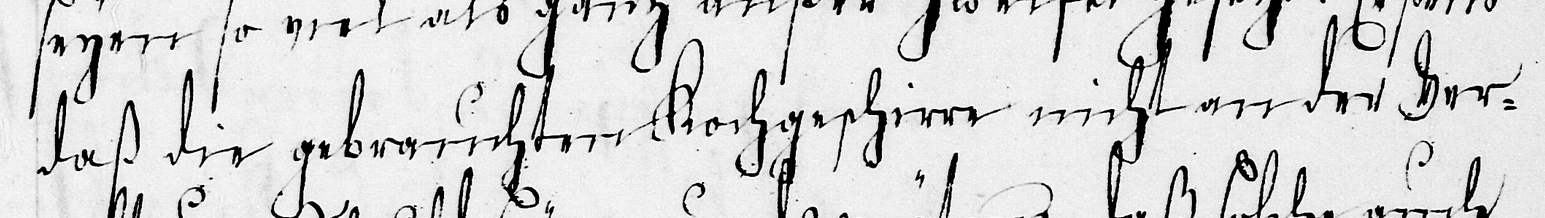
daß die gebrauchten Kochgeschirre nicht an der Ver¬
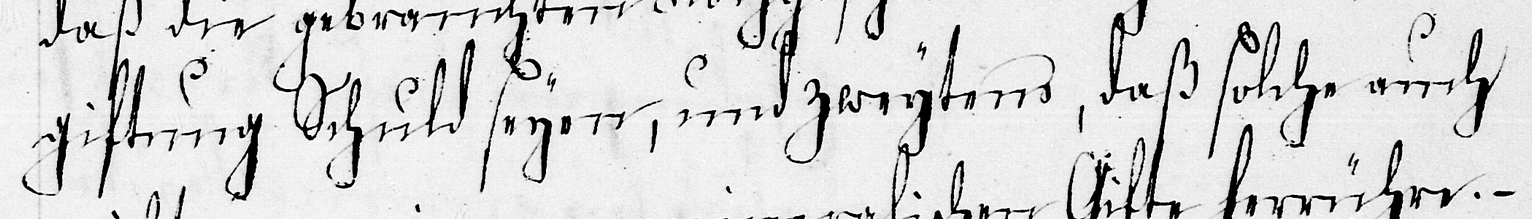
giftung Schuld seyen, und zweytens, daß solche auch
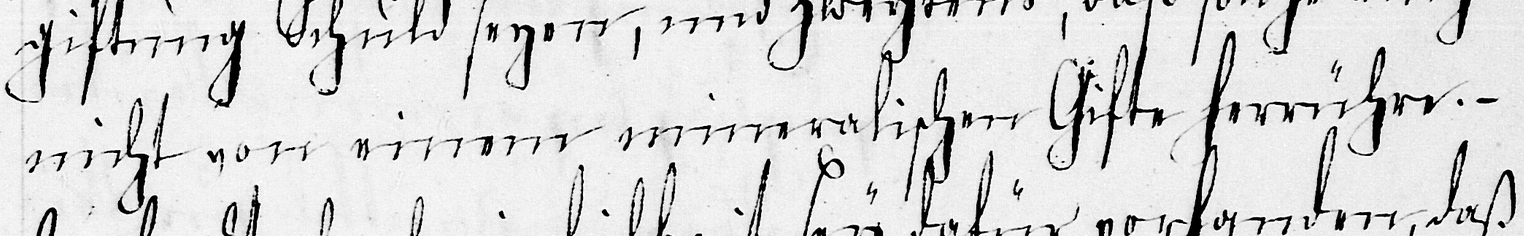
nicht von einem mineralischen Gifte herrühre.
